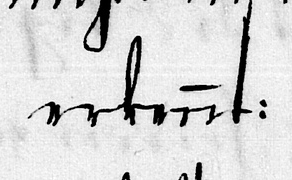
erkennt:
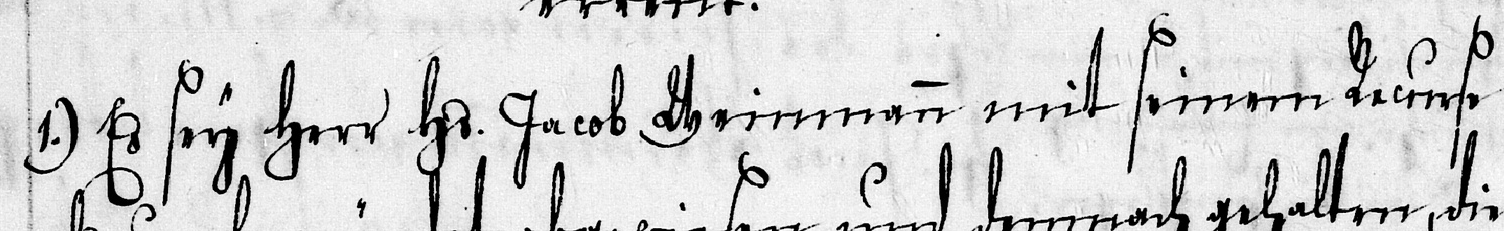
1.) Es sey Herr Hs. Jacob Weinmann mit seinem Recurse
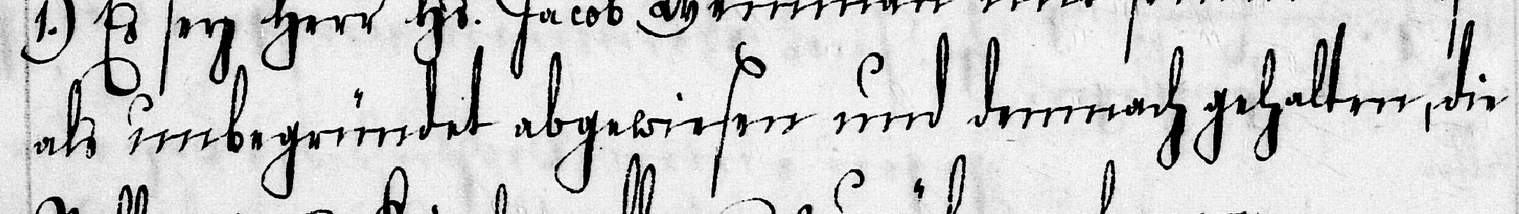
als unbegründet abgewiesen und demnach gehalten, die
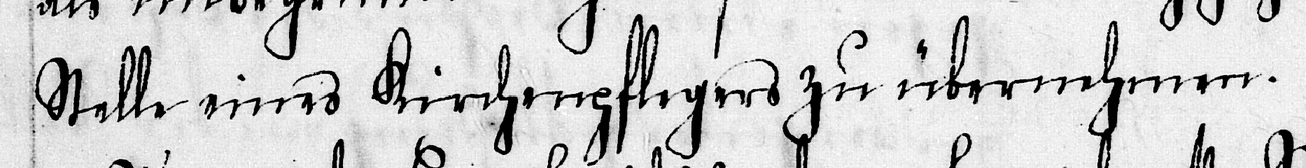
Stelle eines Kirchenpflegers zu übernehmen.
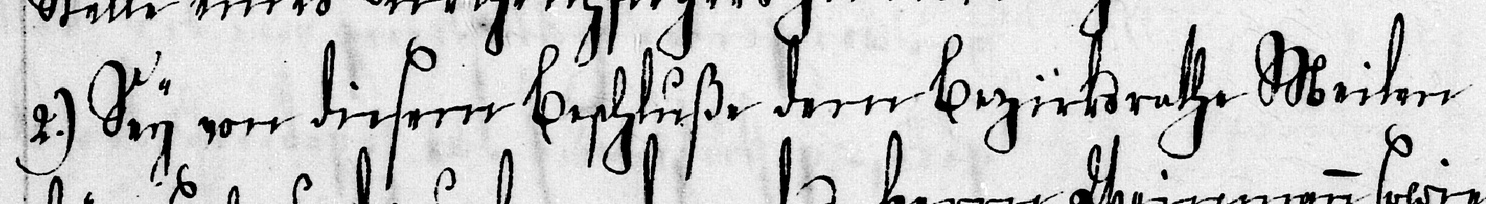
2.) Sey von diesem Beschluße dem Bezirksrathe Meilen
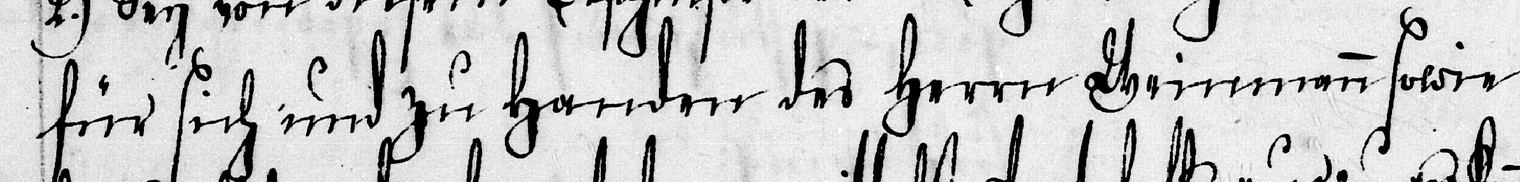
für sich und zu Handen des Herrn Weinmann sowie
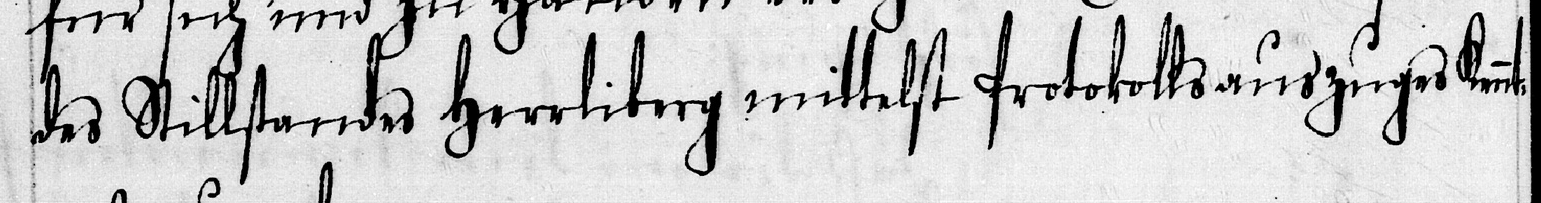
des Stillstandes Herrliberg mittelst Protokollsauszuges Ken¬
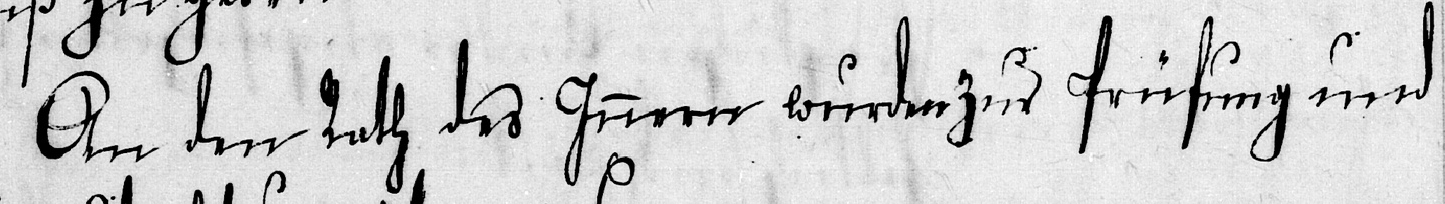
An den Rathe des Innern wurden zur Prüfung und
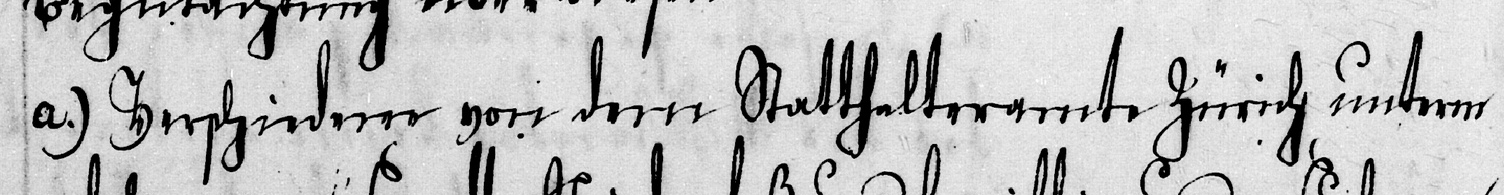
a.) Verschiedene von dem Statthalteramte Zürich unterm
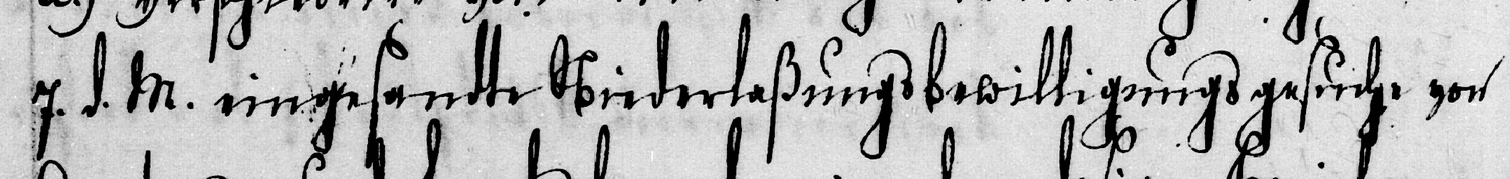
7. d. M. eingesandte Niederlaßungsbewilligungsgesuche von
